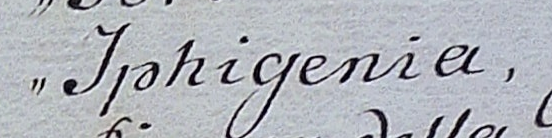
" Iphigenia,
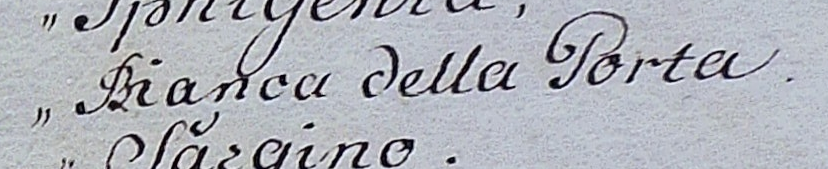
" Bianca della Porta.
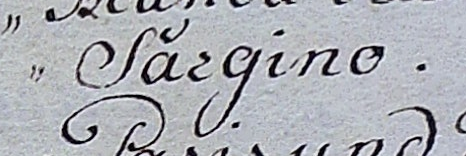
" Sargino.
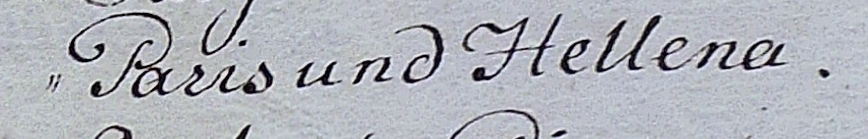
" Paris und Hellena.
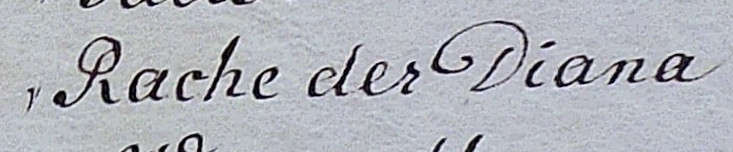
" Rache der Diana
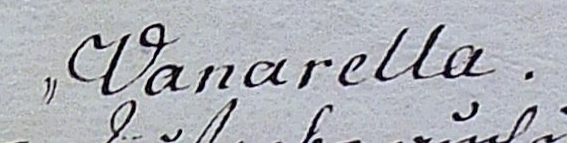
" Vandarella.
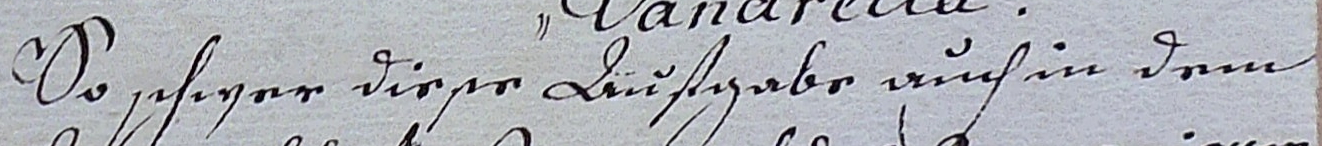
So schwer diese Aufgabe auch in dem
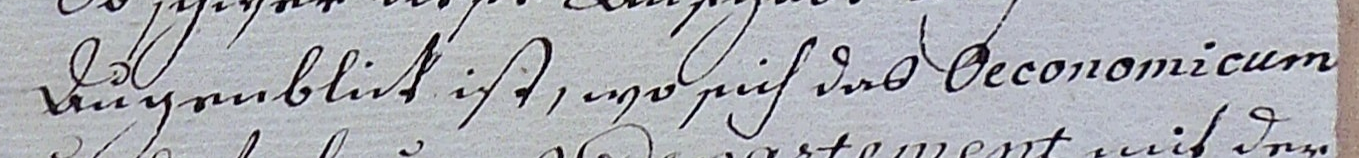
Augenblick ist, wo sich das Oeconomicum
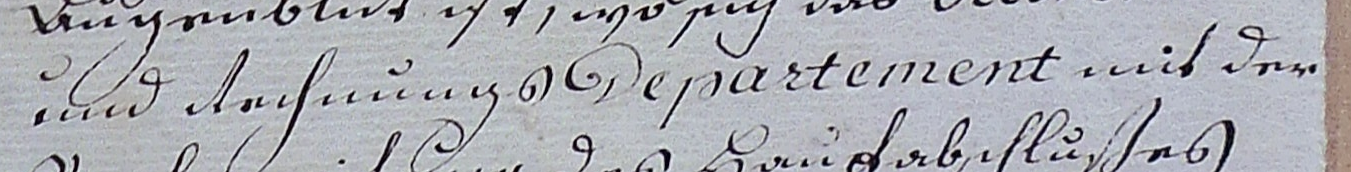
und Rechnungs Department mit der
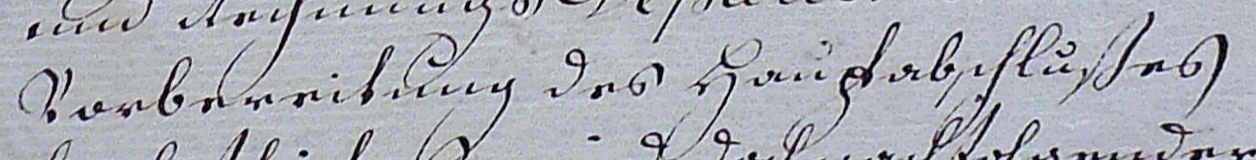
Vorbereitung des Hauptabschlußes
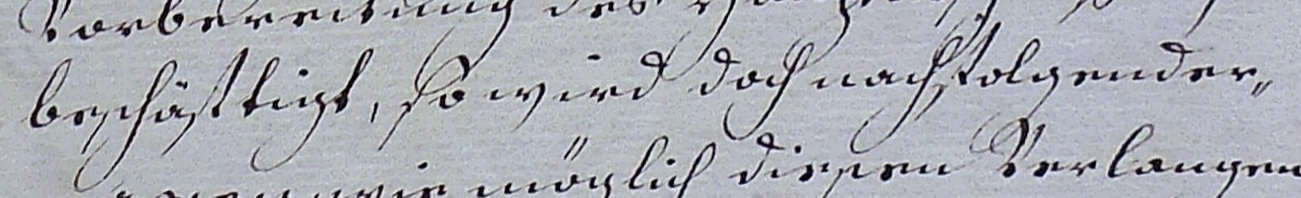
beschäftigt, so wird doch nach folgender¬
